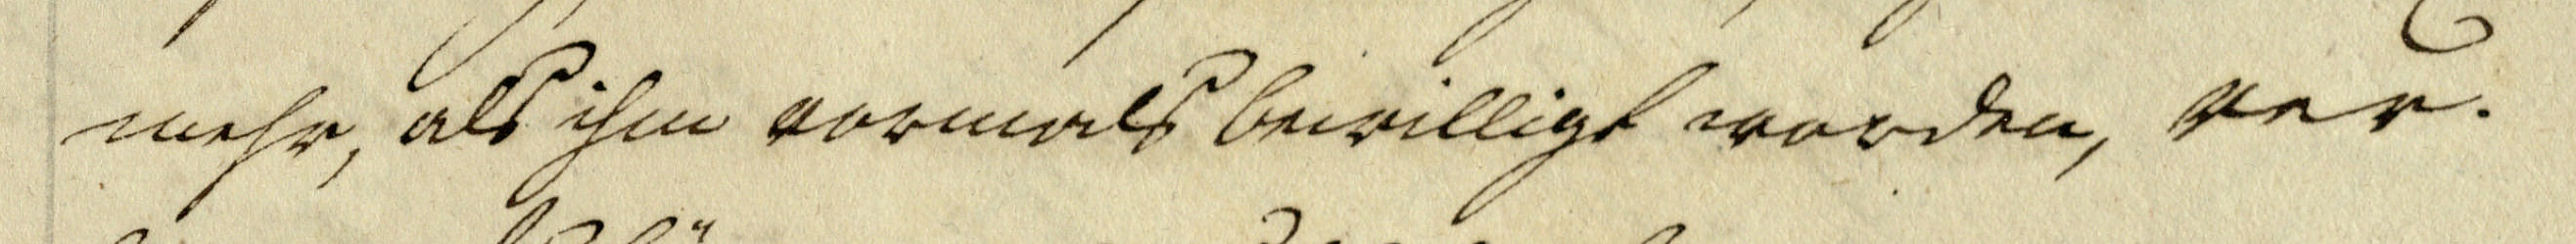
mehr, als ihm vormals bewilligt worden, ver¬
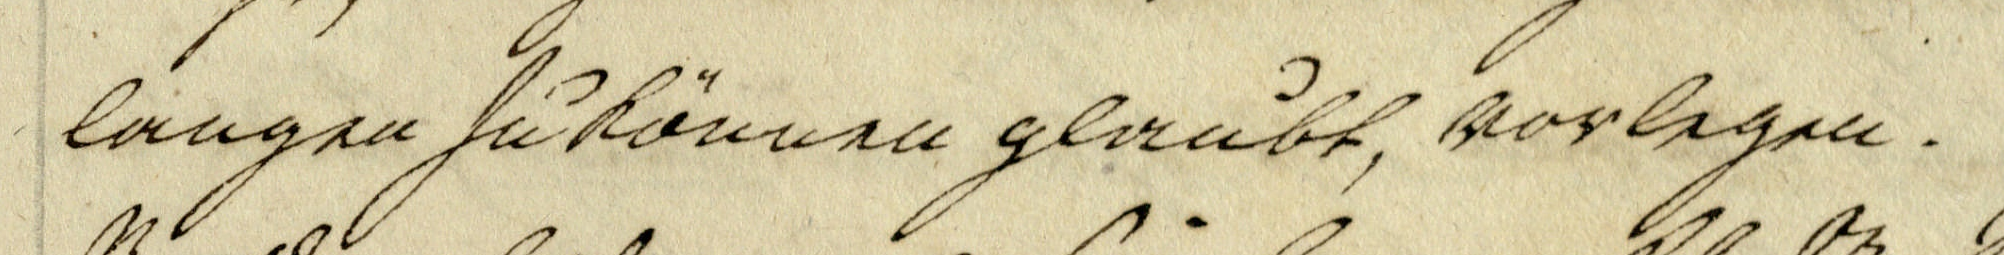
langen zukönnen glaubt, vorlegen.
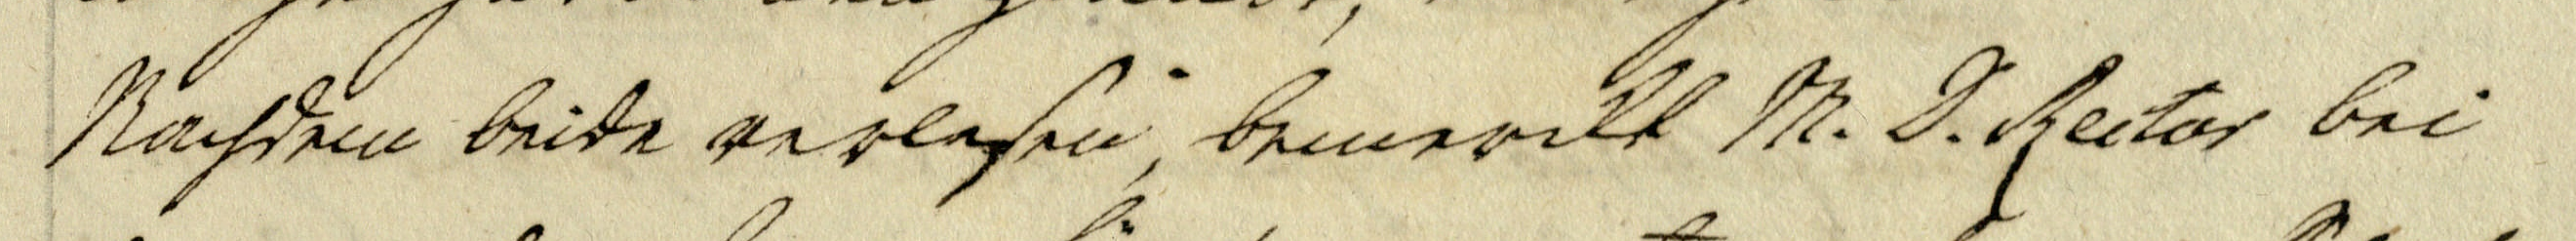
Nachdem beide verlesen, bemerckt M. D. Rector bei
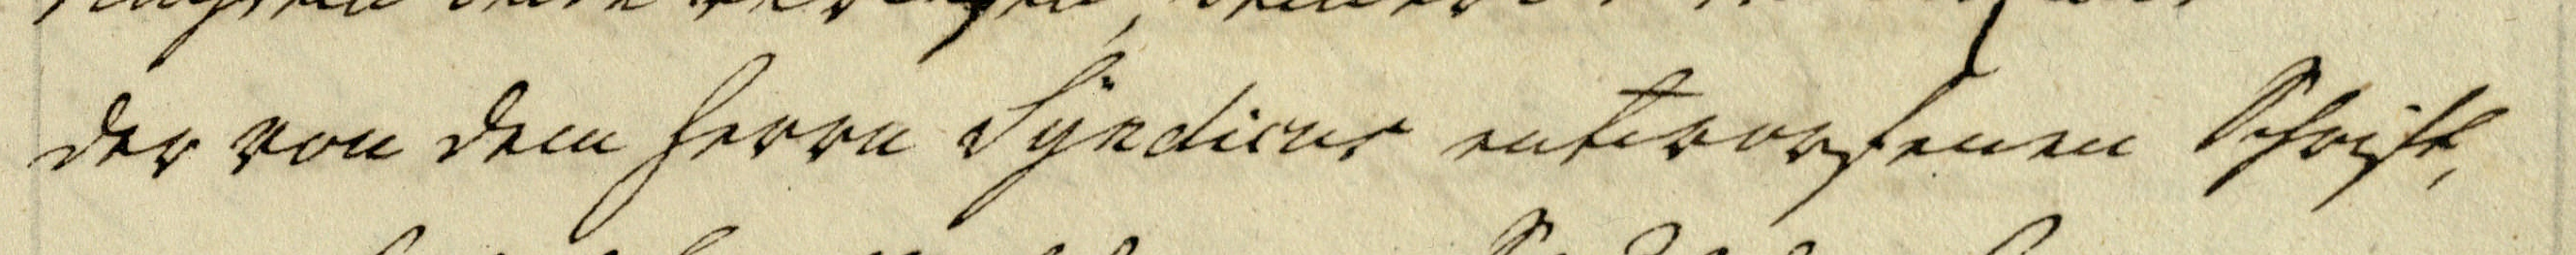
der von dem Herrn Sÿndicus entworfenen Schrift,
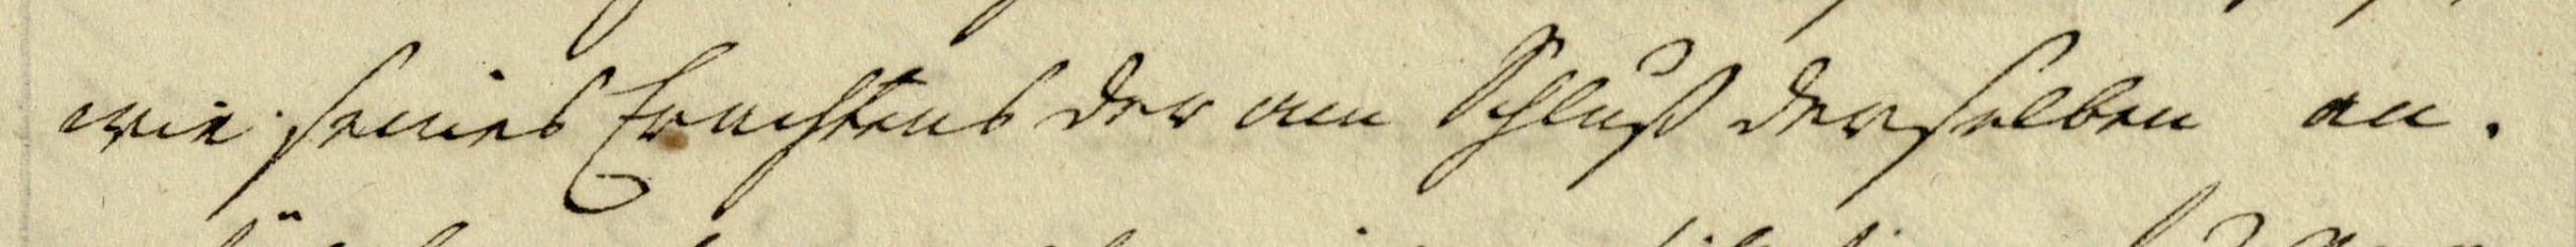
wie seines Erachtens der am Schluß derselben an¬
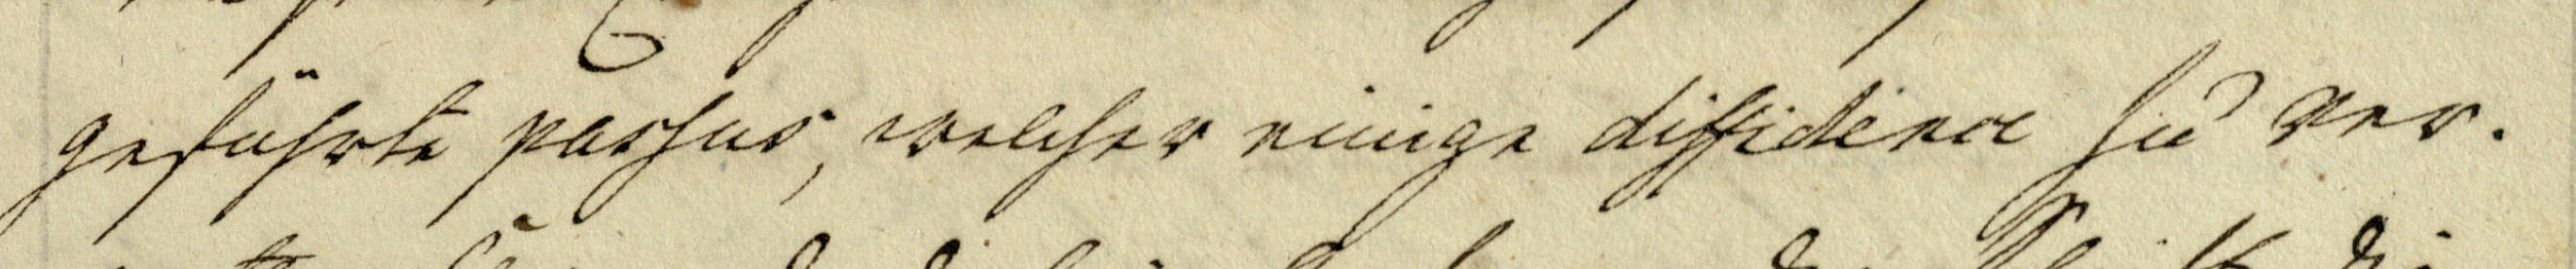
geführte passus, welcher einige diffidence zu ver¬
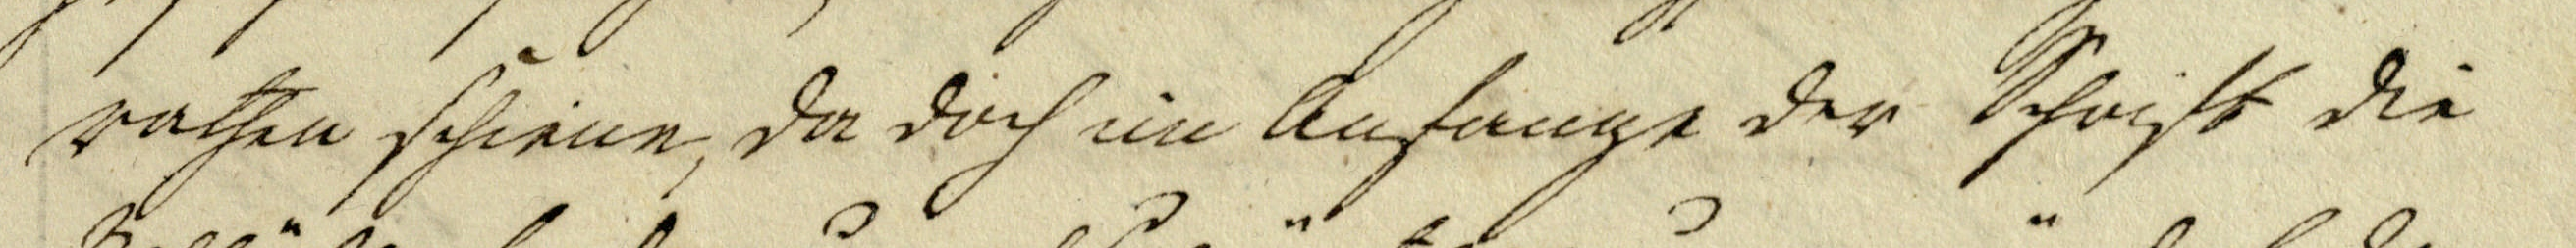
rathen schiene, da doch im Anfange der Schrift die
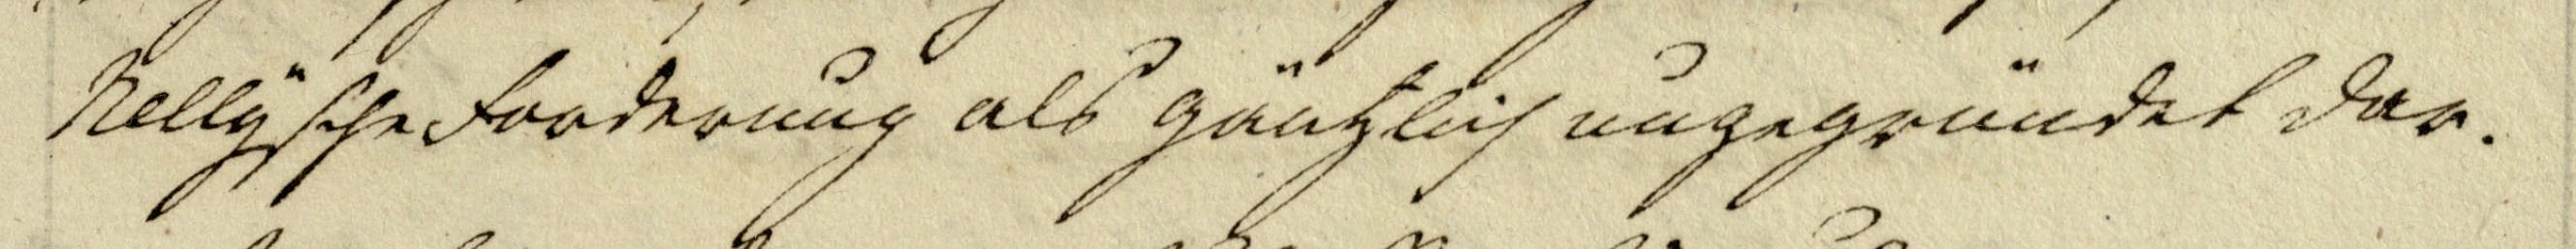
NellÿscheForderung als gäntzlich ungegründet dar¬
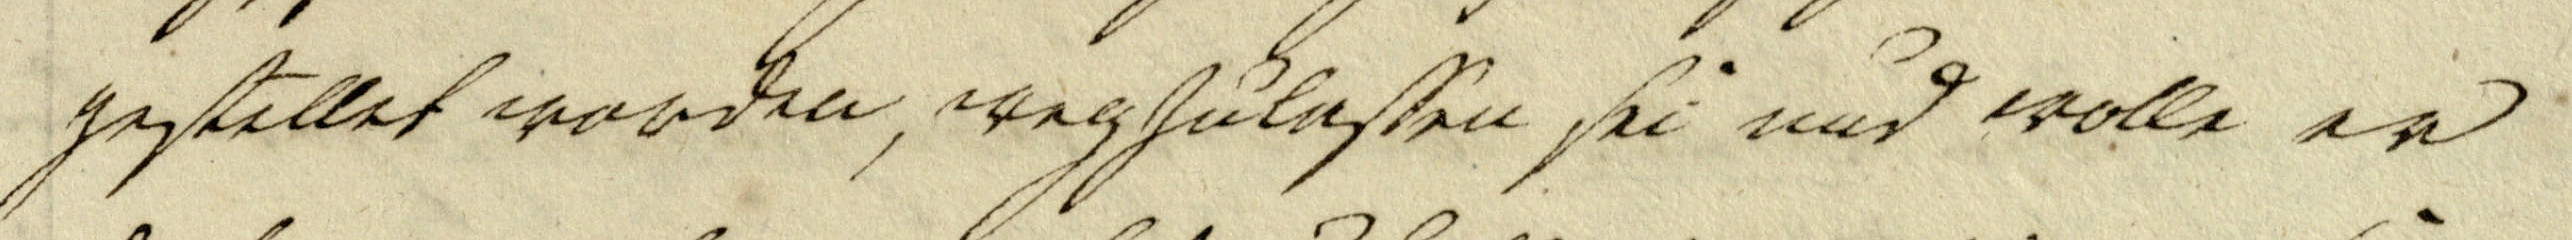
gestellet worden, wegzulassen sei und wolle er
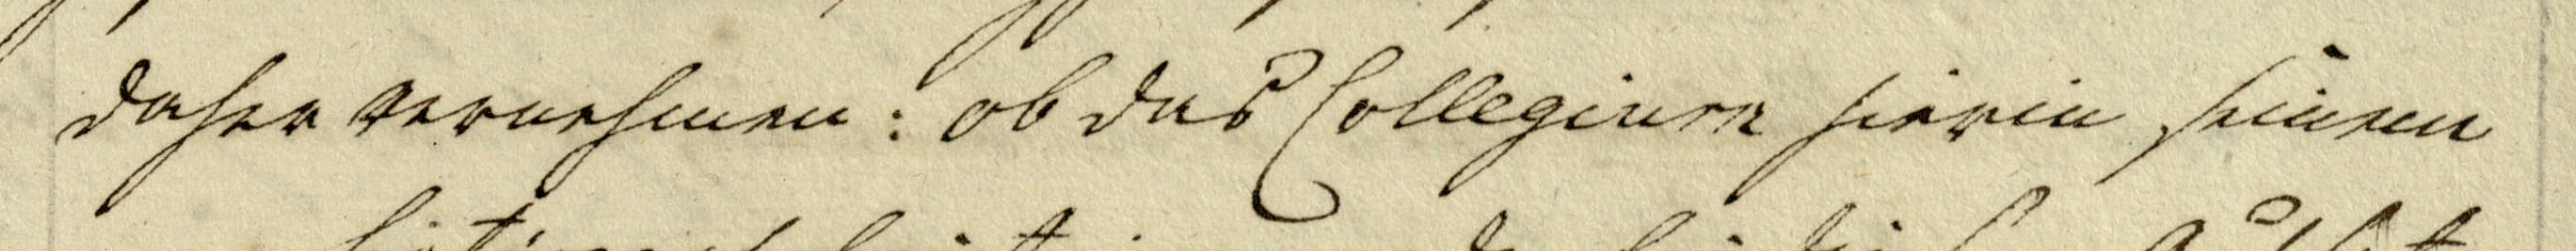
daher vernehmen: ob das Collegium hierin seinem
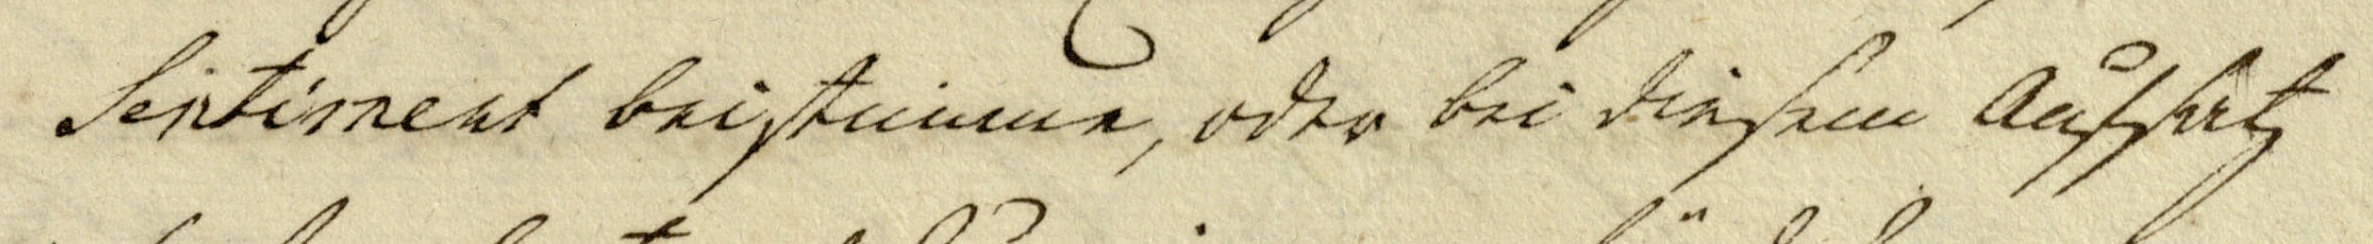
Sentiment beistimme, oder bei diesem Aufsatz
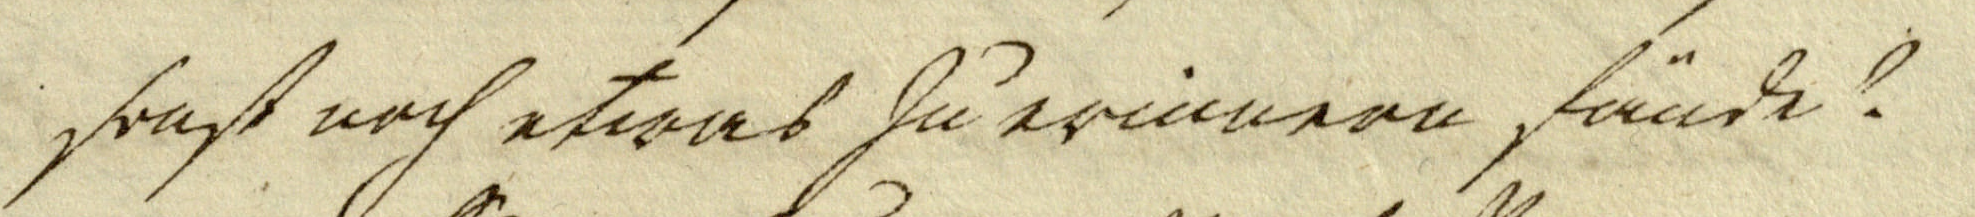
sonst noch etwas zu erinnern fände ?
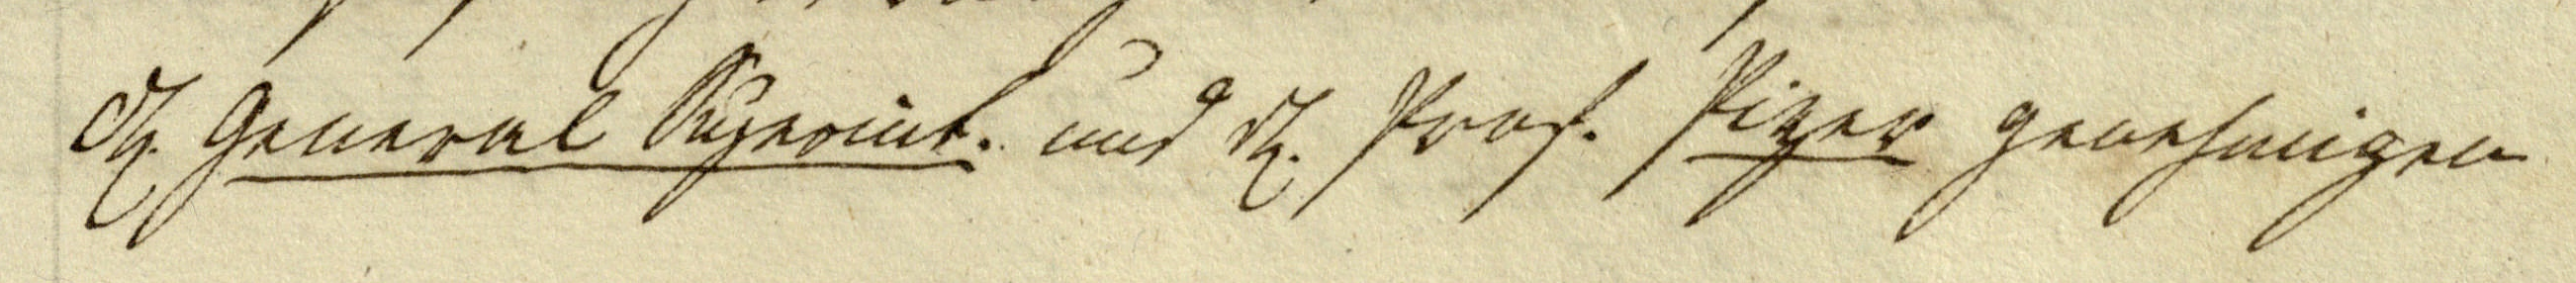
dh General Superint. und dh. Prof. Piper genehmigen
